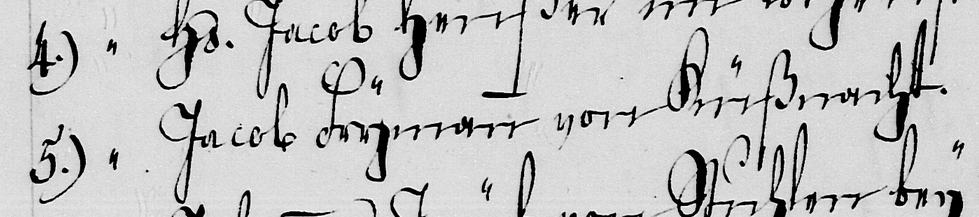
5.) “ Jacob Frymann von Küßnacht.
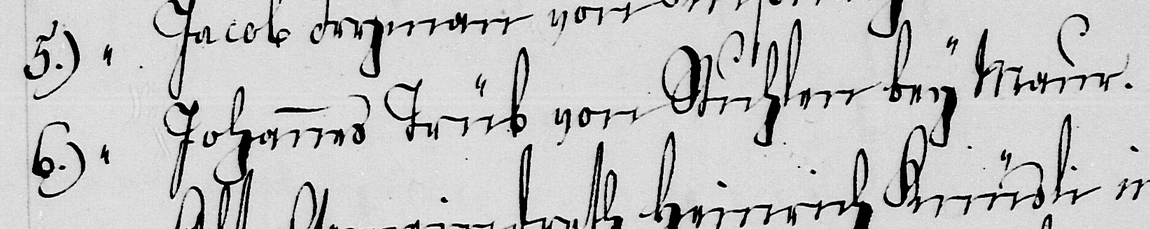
6.) “ Johannes Trüb von Stuhlen bey Maur.
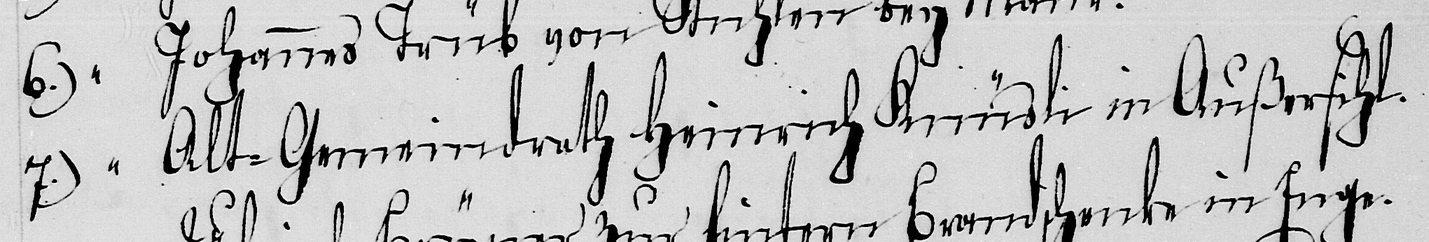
7.) “ Alt-Gemeindrath Heinrich Knüsli in Außersihl.
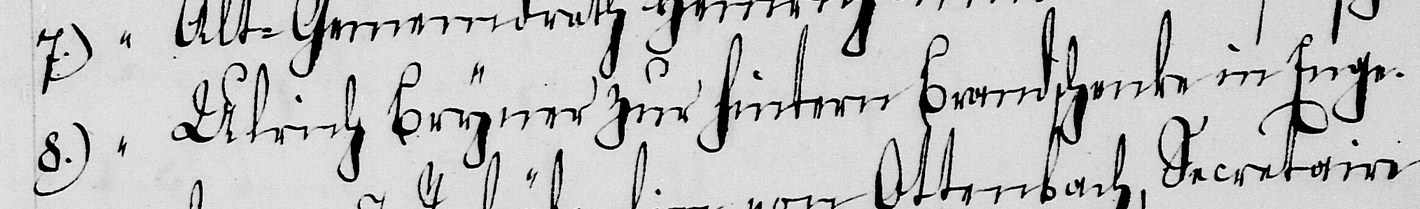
8.) “ Ulrich Bryner zur Hintern Brandschenke in Enge.
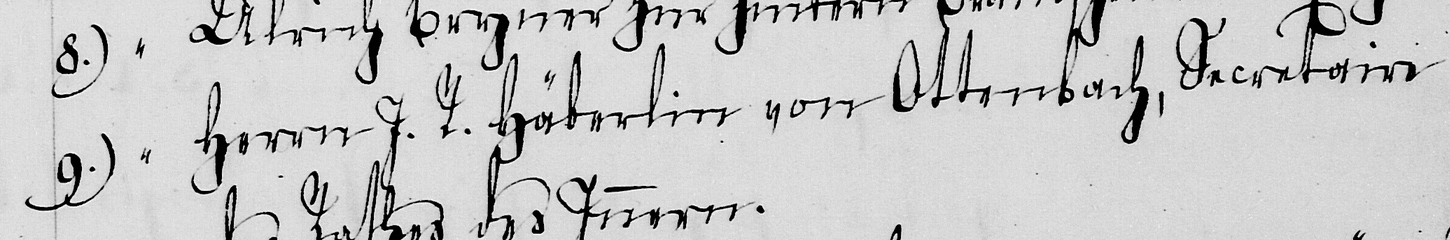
9.) “ Herrn J. R. Häberlein von Ottenbach, Secretaire
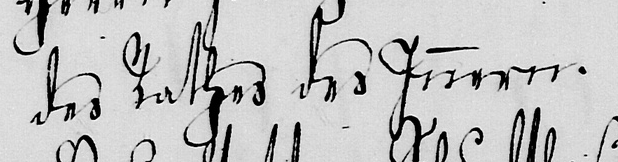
des Rathes des Innern.
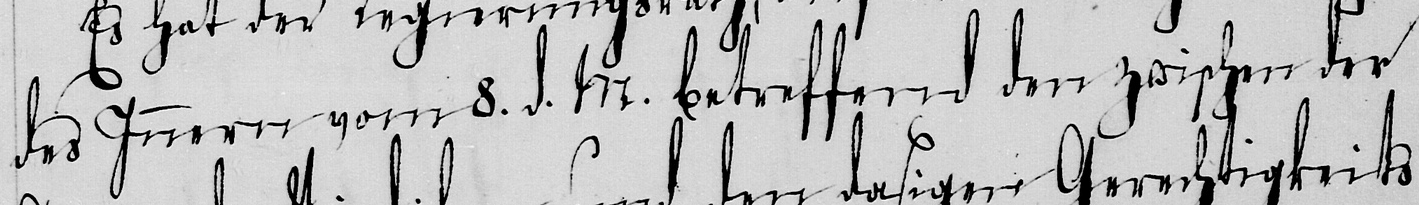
des Innern vom 8. d. M. betreffend den zwischen der
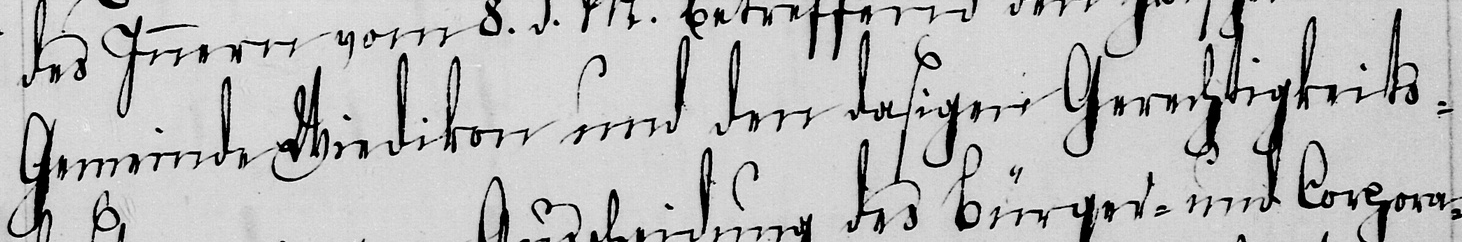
Gemeinde Wiedikon und den dasigen Gerechtigkeits¬
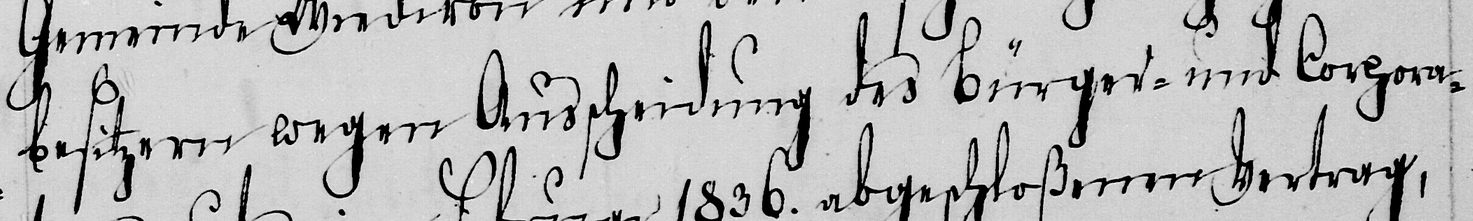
besitzern wegen Ausscheidung des Bürger- und Corpora¬
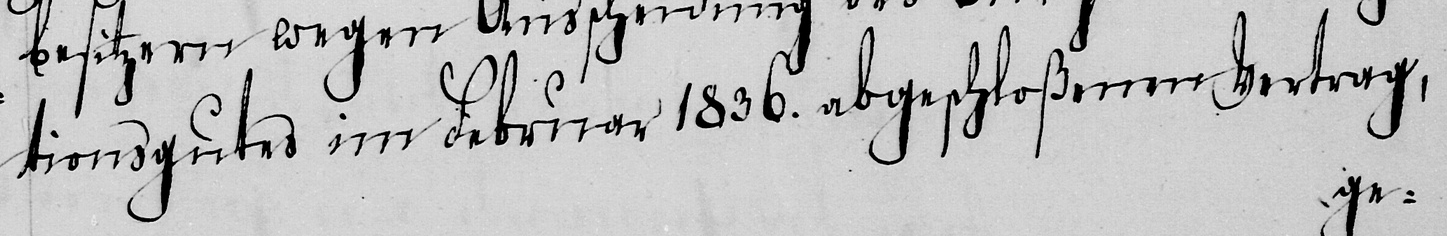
tionsgutes im Februar 1836. abgeschloßenen Vertrag,
